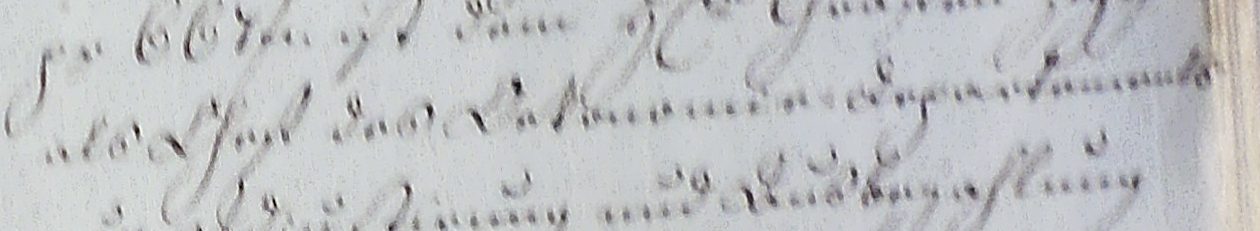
als Chef des Oekonomie=Departements
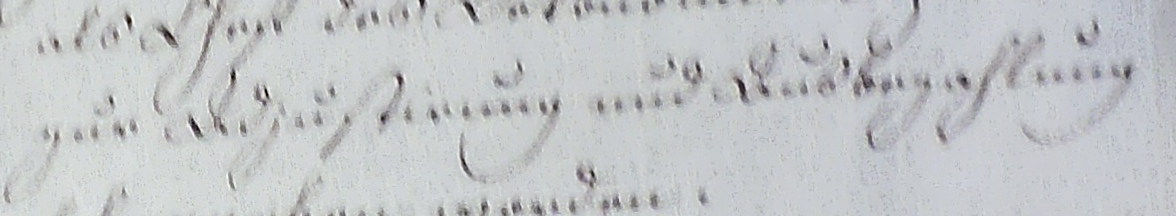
zur Adjustierung und Ausbezahlung
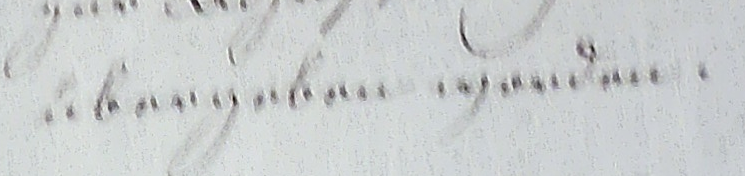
übergeben worden.
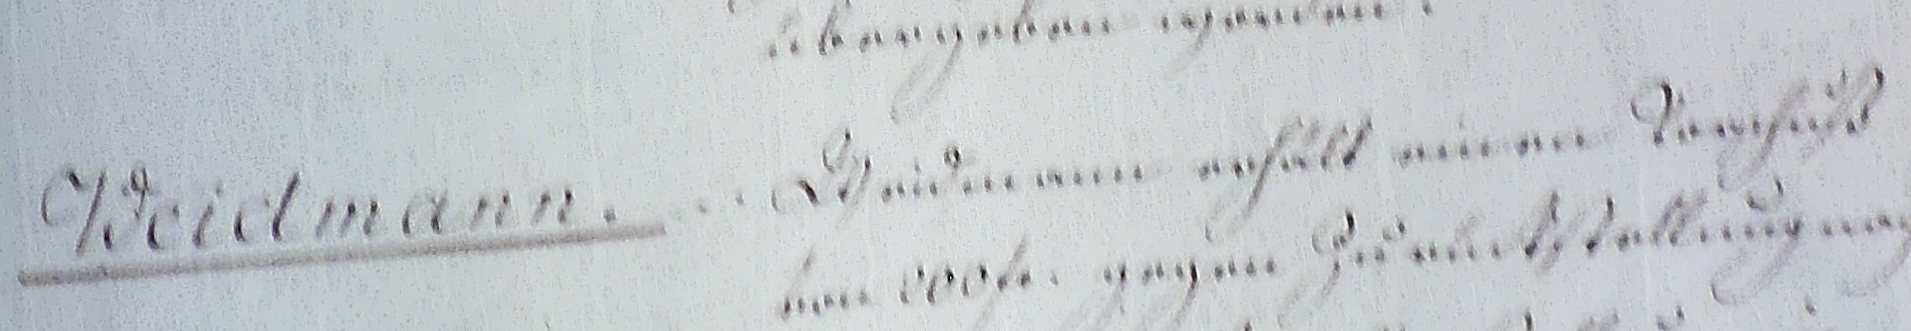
Weidmann. . . Weidmann erhält einen Vorschuß
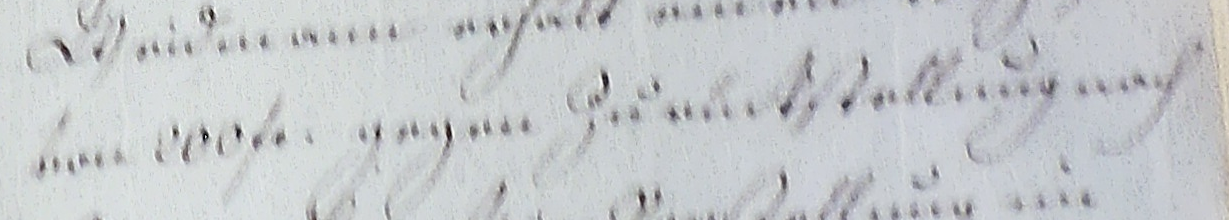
von 200fr. gegen Zurückstellung nach
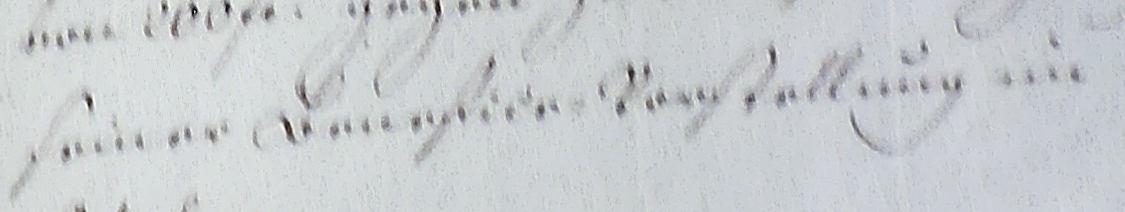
seiner Benefice=Vorstellung im
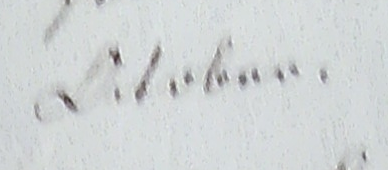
October.
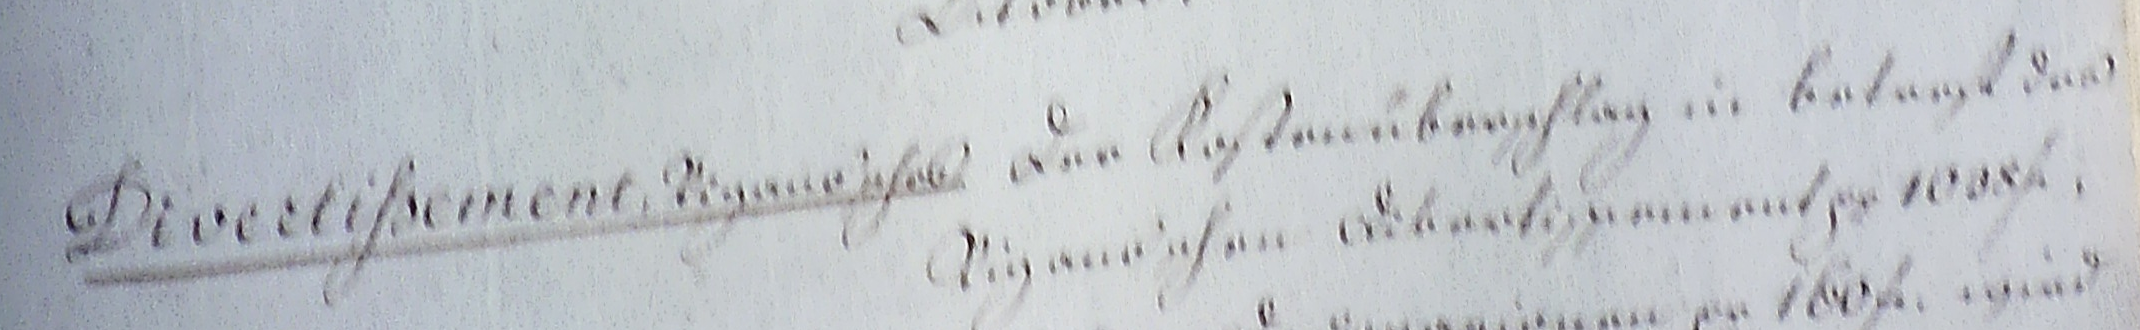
Divertissement, Vigano'sches Der Kostenüberschlag in betref des
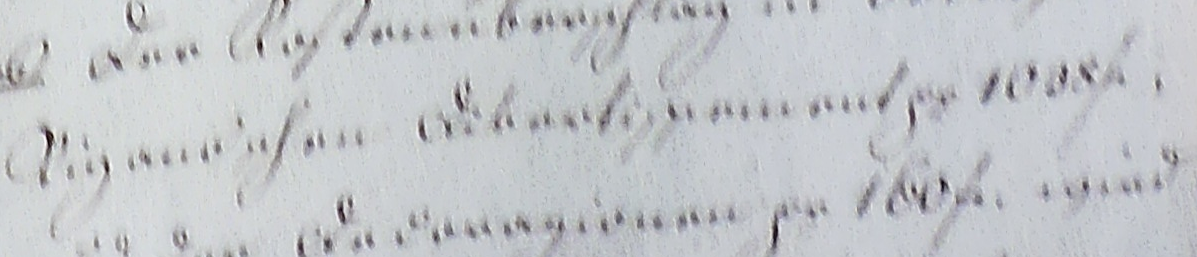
Viganoscheen Divertissement pr͇ 1008fr.,
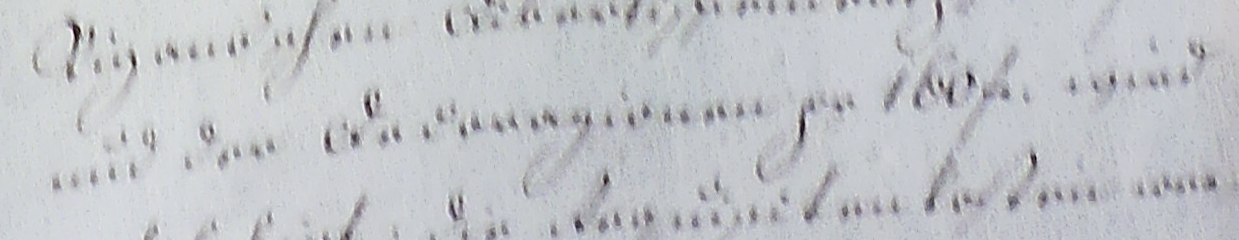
und den Decorazionen pr͇ 160fr. wird
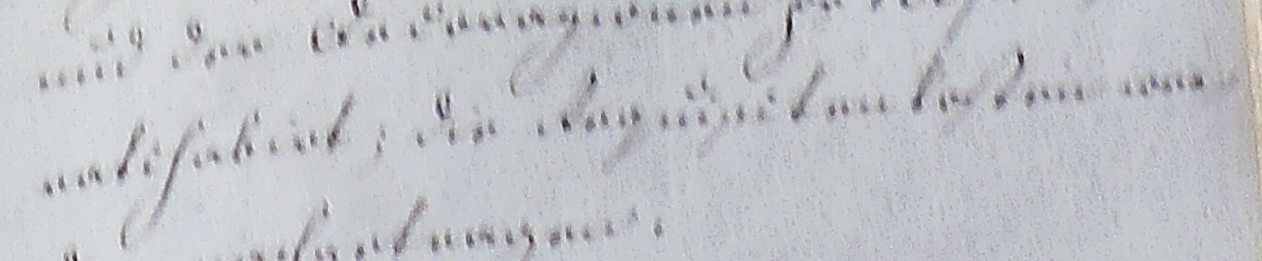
ratihabirt; die Requisiten Kosten wer¬
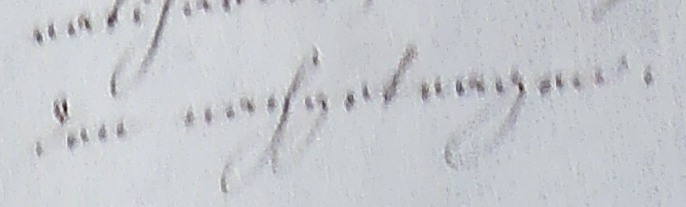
den nachgetragen.
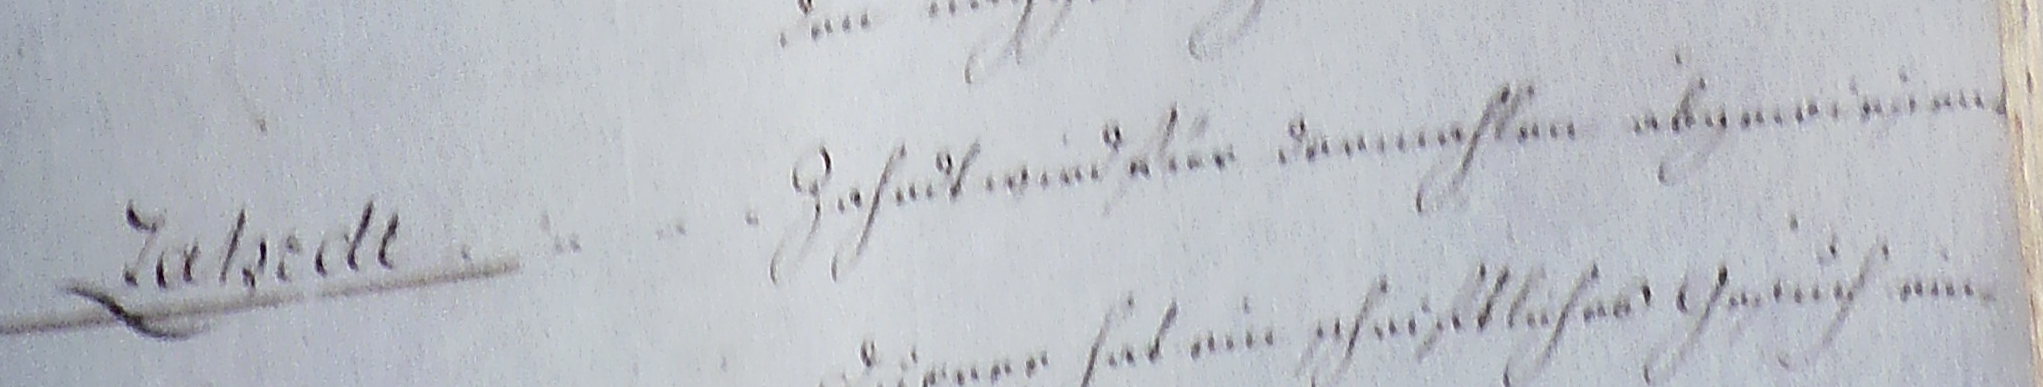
Zahedt . .. .. Zahedt wird für dermahlen abgewiesen.
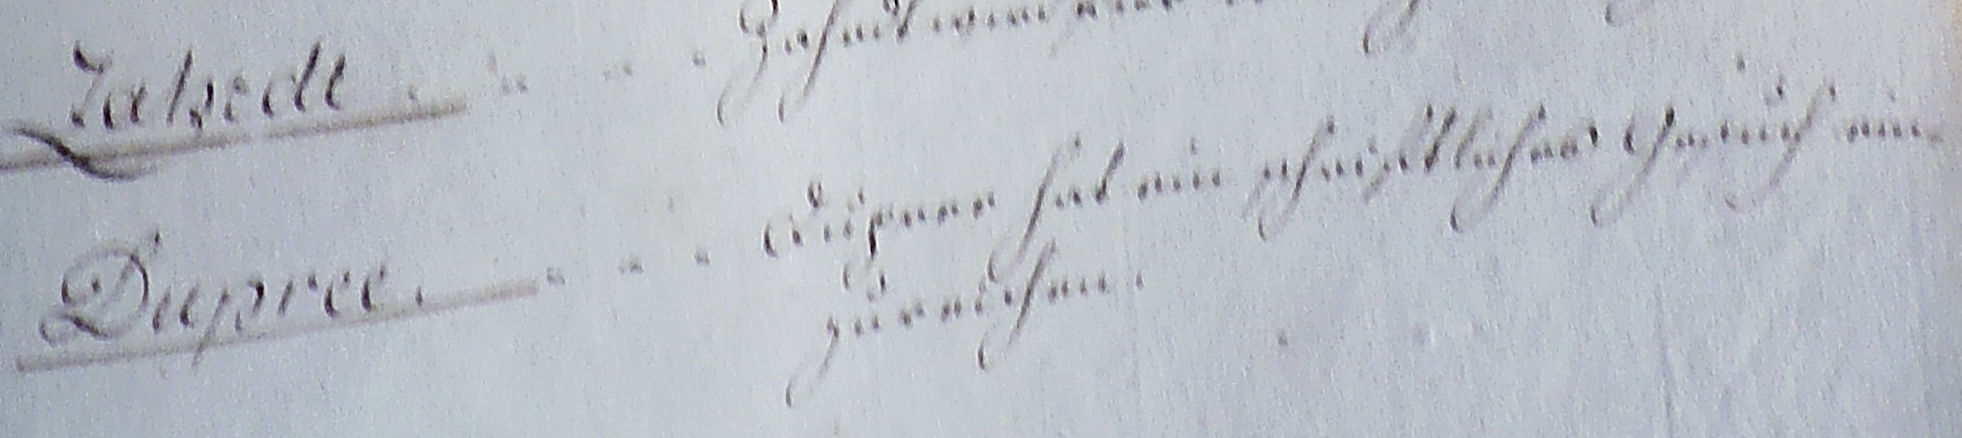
Dupree. .. .. .. Dupree hat ein schriftliches Gesuch ein
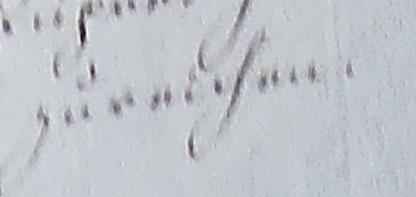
zureichen.
